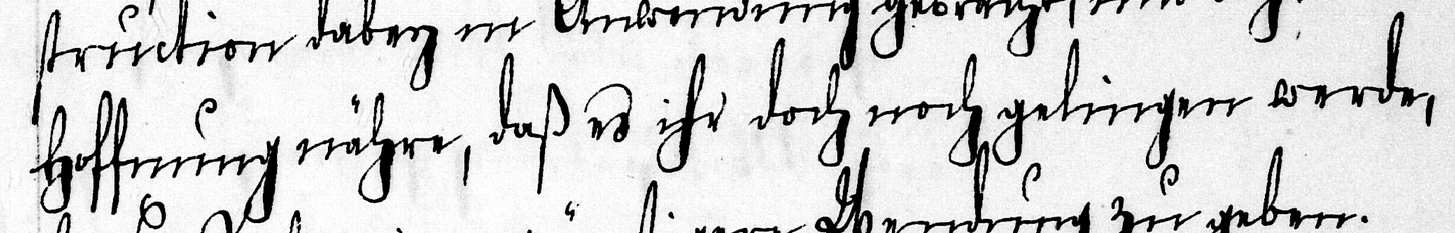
Hoffnung nähre, daß es ihr doch noch gelingen werde,
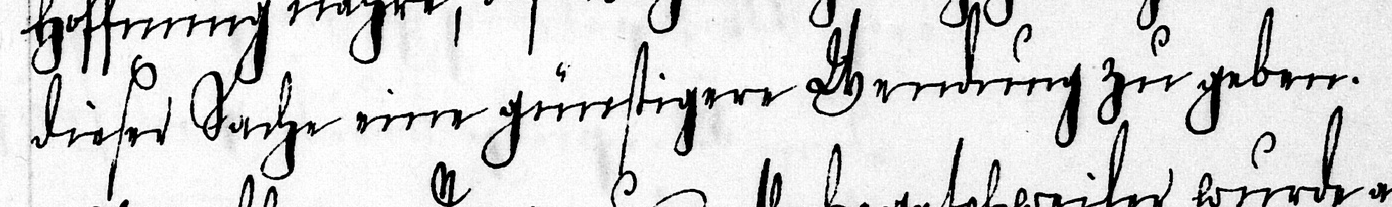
dieser Sache eine günstigere Wendung zu geben.
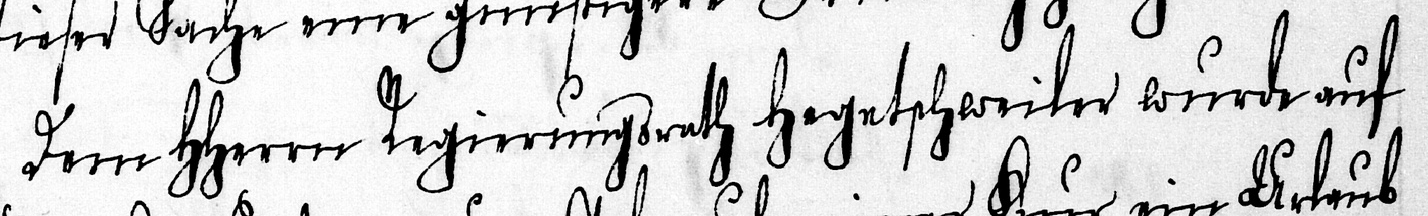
Dem HHerrn Regierungsrath Hegetschweiler wurde auf
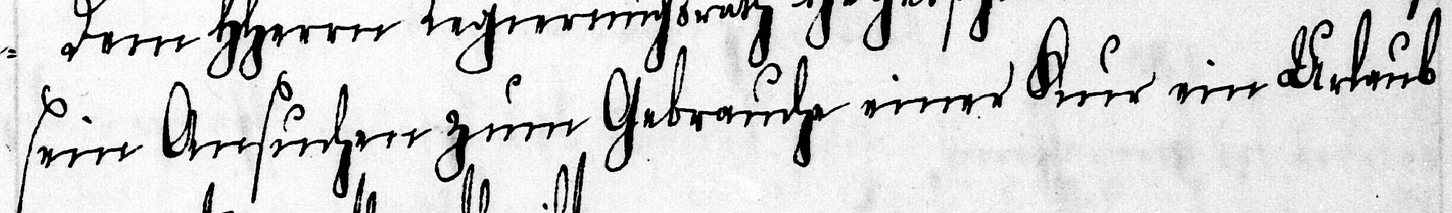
sein Ansuchen zum Gebrauche einer Kur ein Urlaub
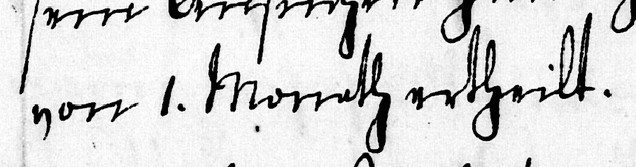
von 1. Monath ertheilt.
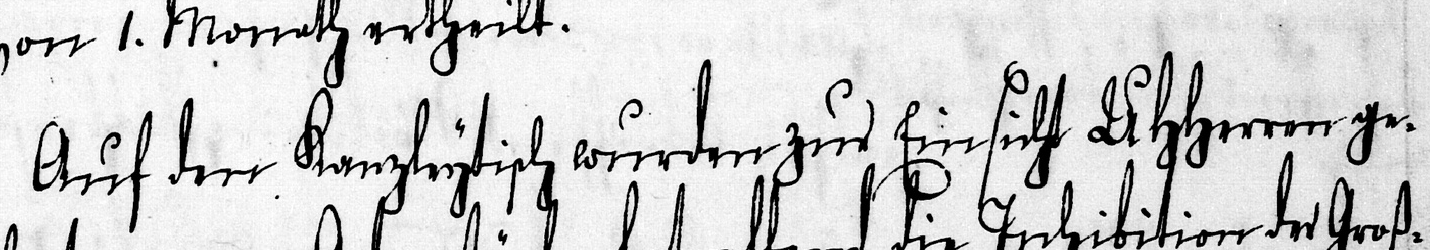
Auf den Kanzleytisch wurden zur Einsicht UHHerren ge¬
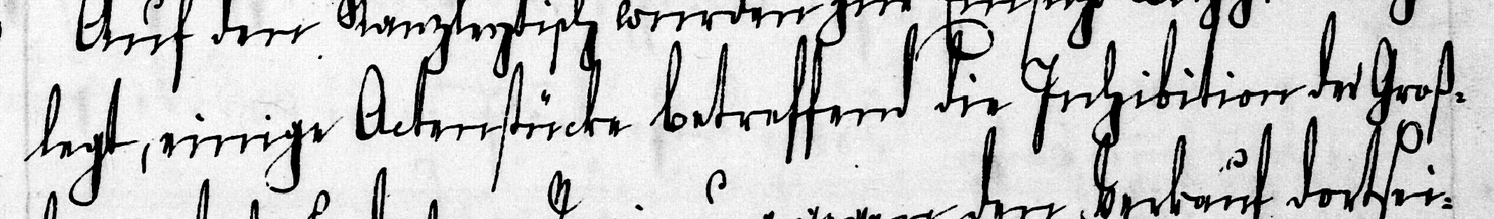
legt, einige Actenstücke betreffend die Inhibition der Groß¬
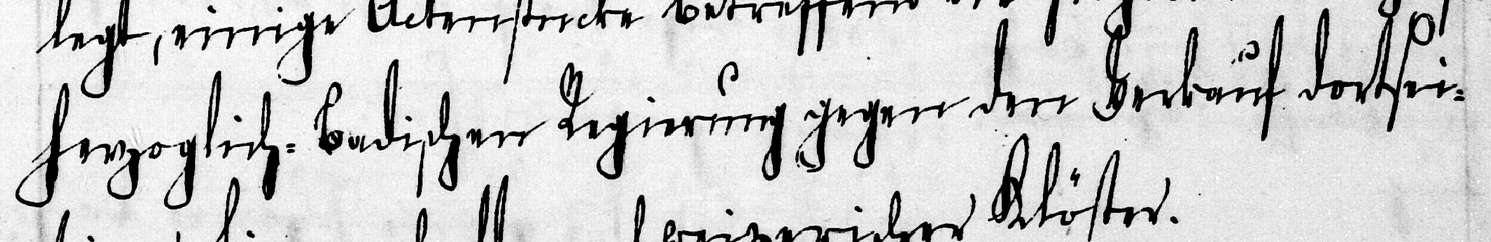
herzoglich-Badischen Regierung gegen den Verkauf dortsei¬
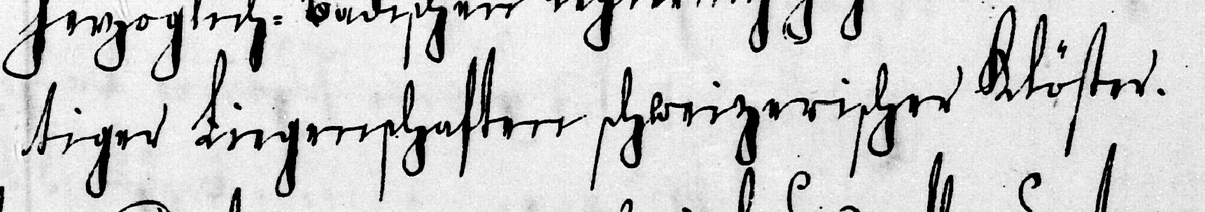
tiger Liegenschaften schweizerischer Klöster.
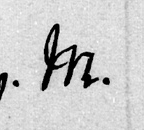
M.
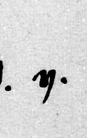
v.
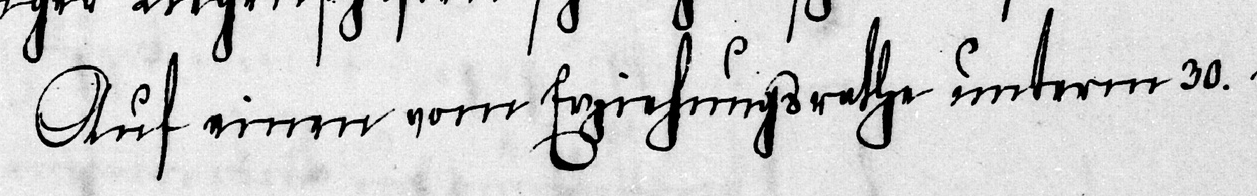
Auf einen vom Erziehungsrathe unterm 30.
